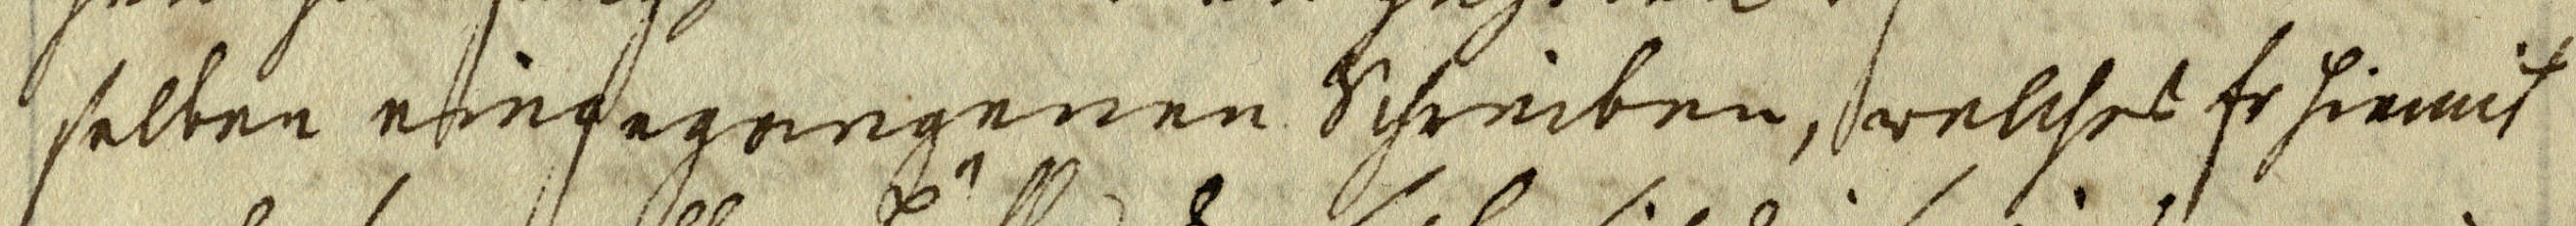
selben eingegangenen Schreiben, welches Er hiemit
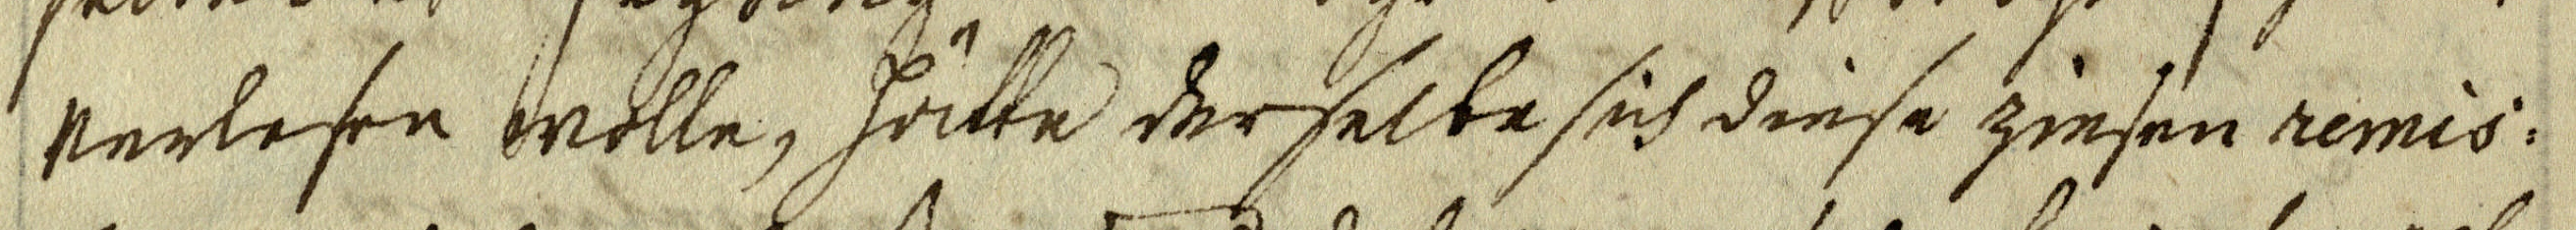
verlesen wolle, hätte derselbe sich diese Zinsen remis¬
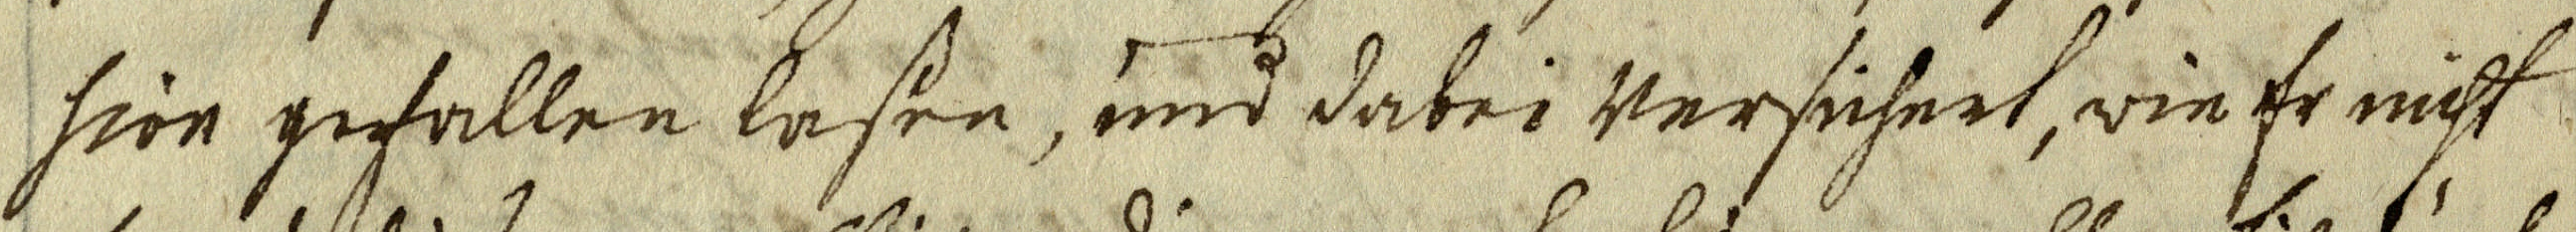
sion gefallen laßen, und dabei versichert, wie Er nicht
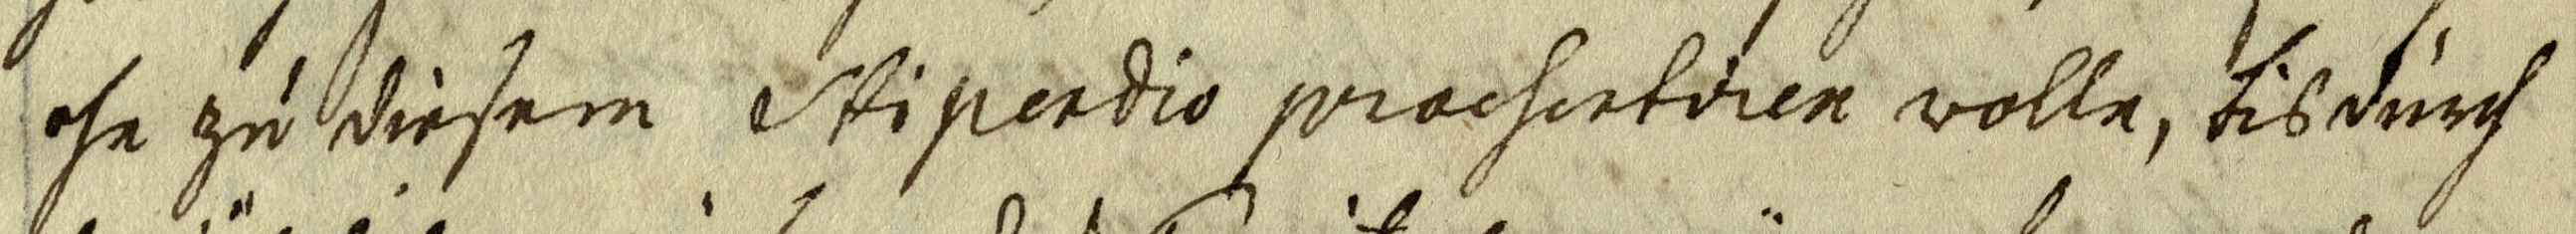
ehe zu diesem Stipendio praesentiren wolle, bis durch
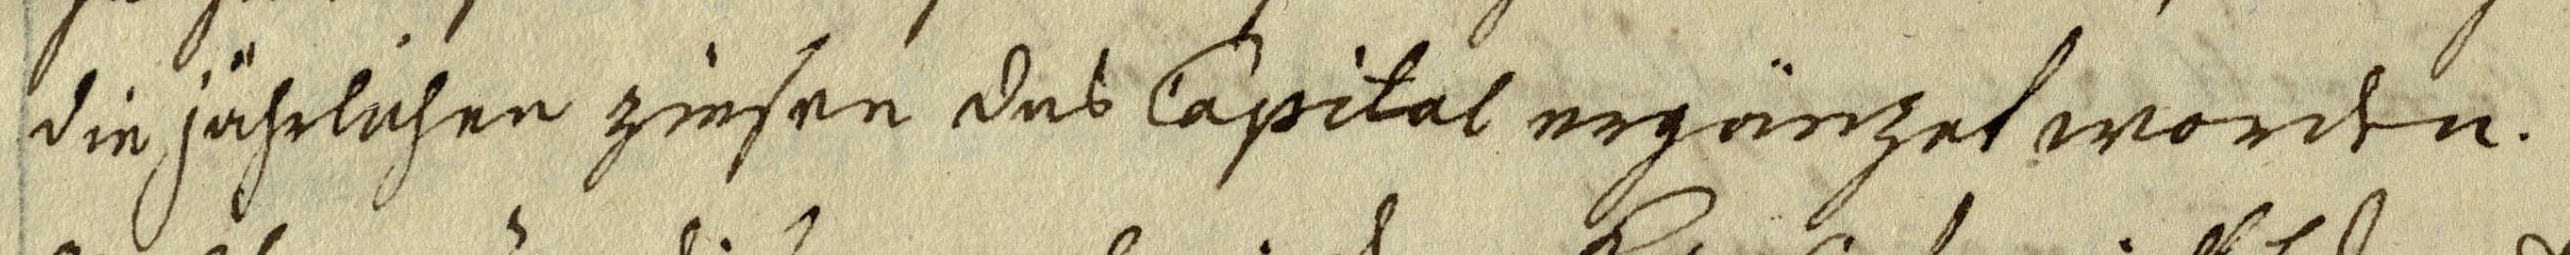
die jährlichen zinsen das Capital ergänzet worden.
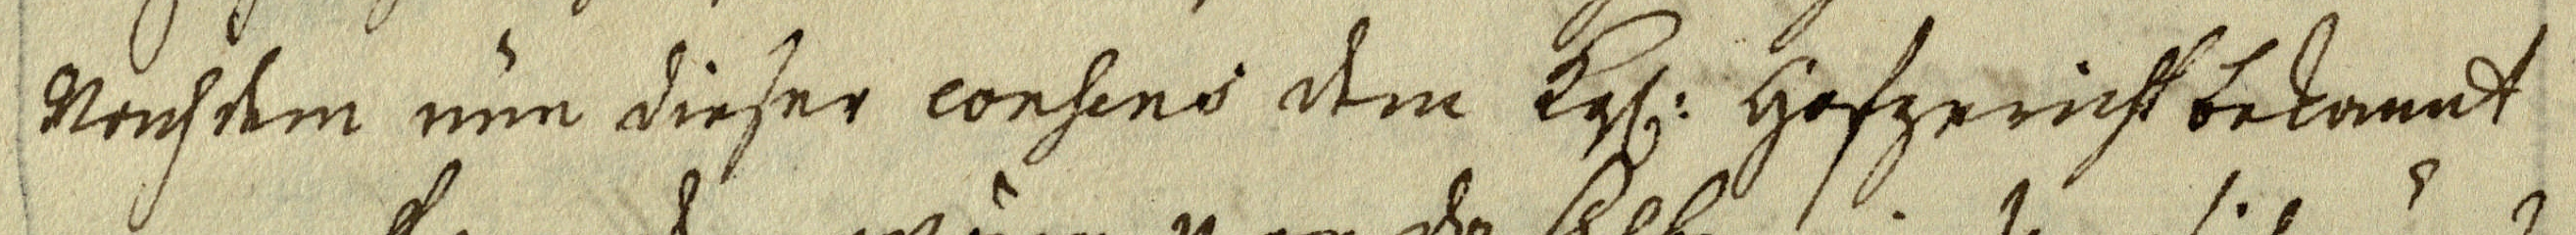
Nach dem nun dieser consens dem Kgl: Hofgericht bekannt
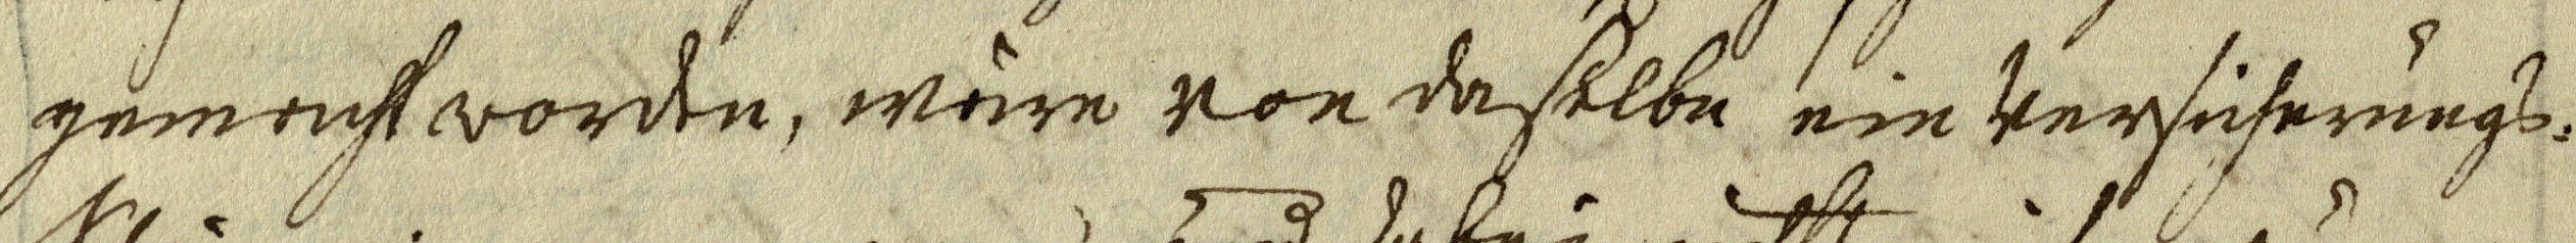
gemacht worden, wäre von daßelbe ein Versicherungs¬
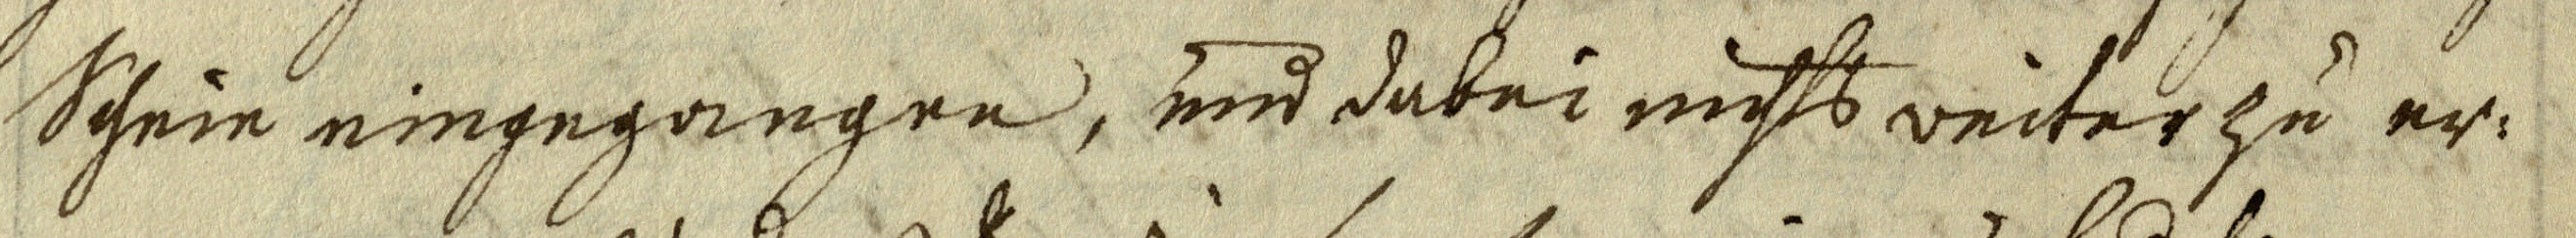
Schein eingegangen, und dabei nichts weiter zu er¬
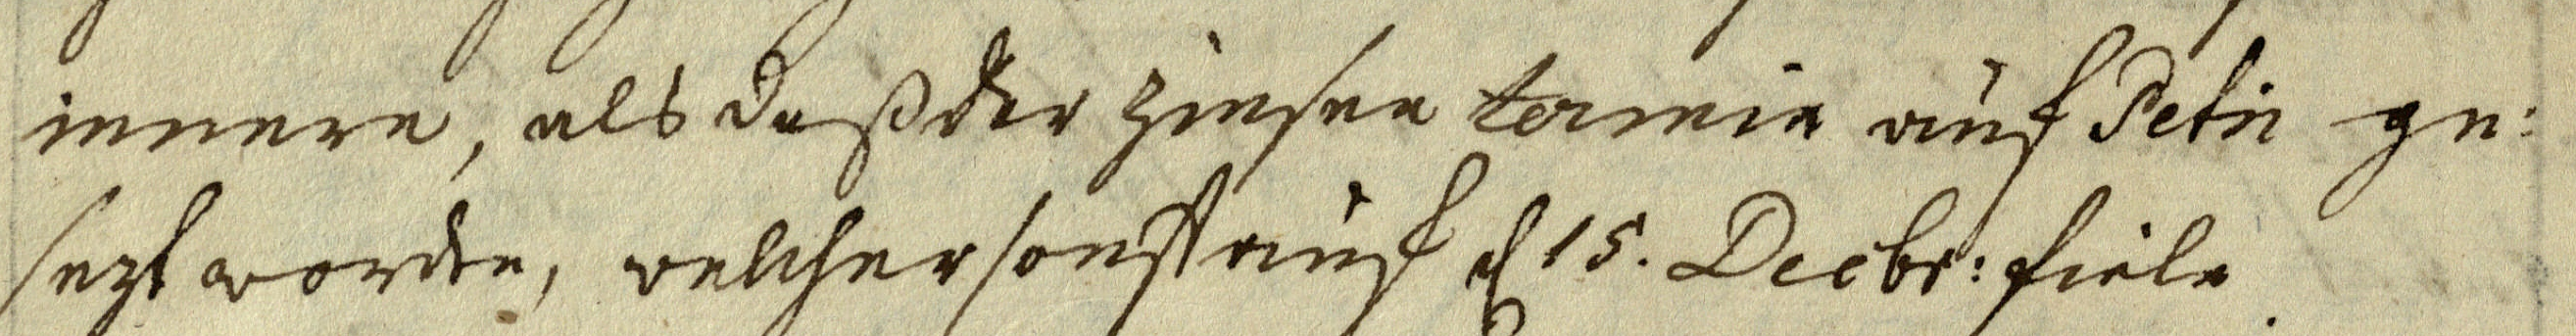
innern, als daß der Zinsen termin auf Petri ge¬
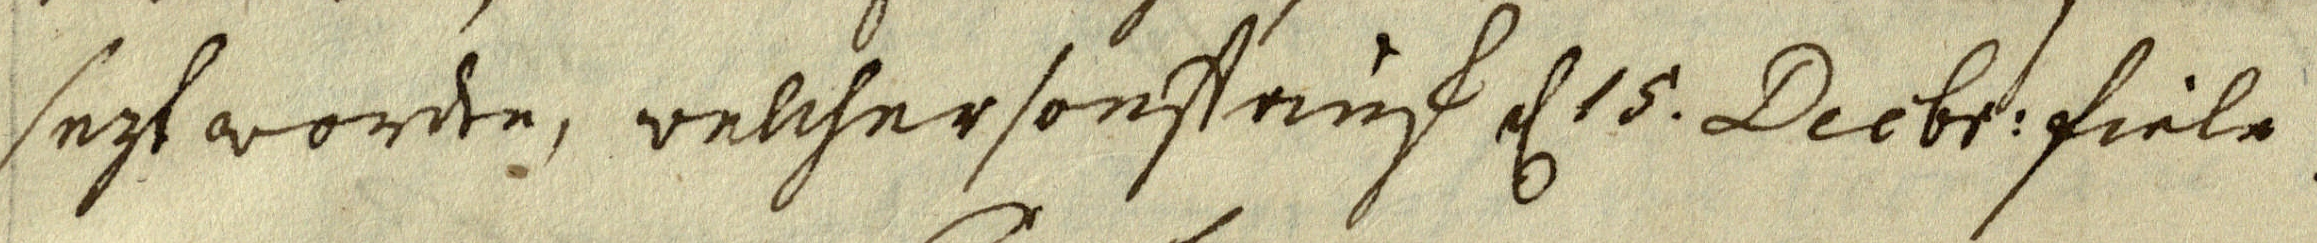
sezt worden, welcher sonst auf d 15. Decbr: fiele
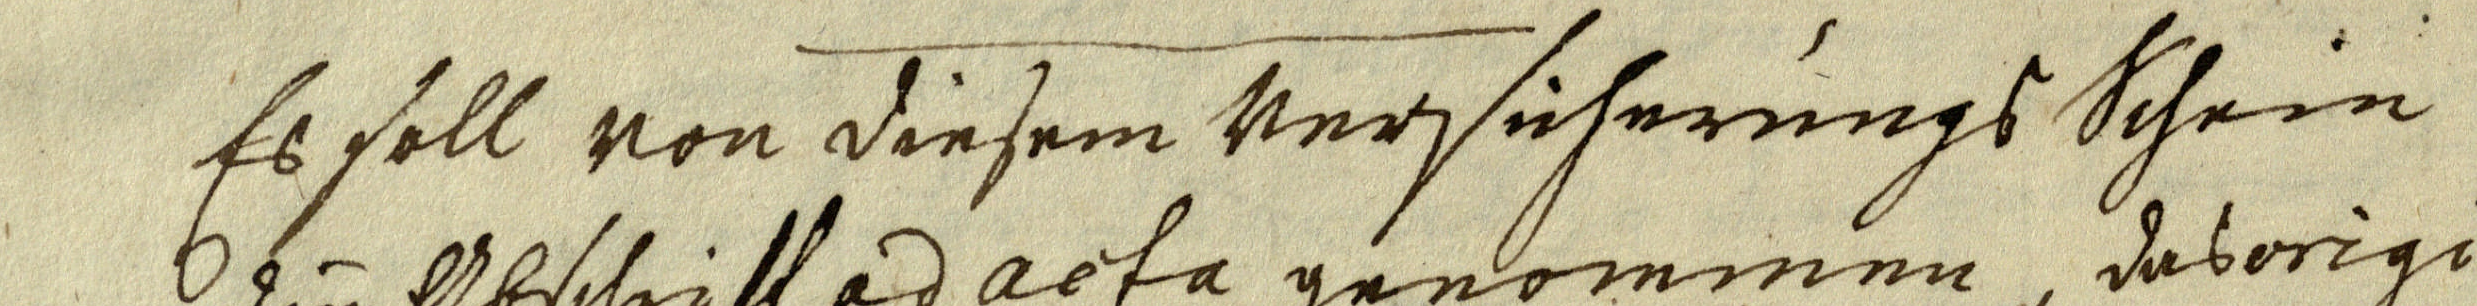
Es soll von diesem Versicherungs Schein
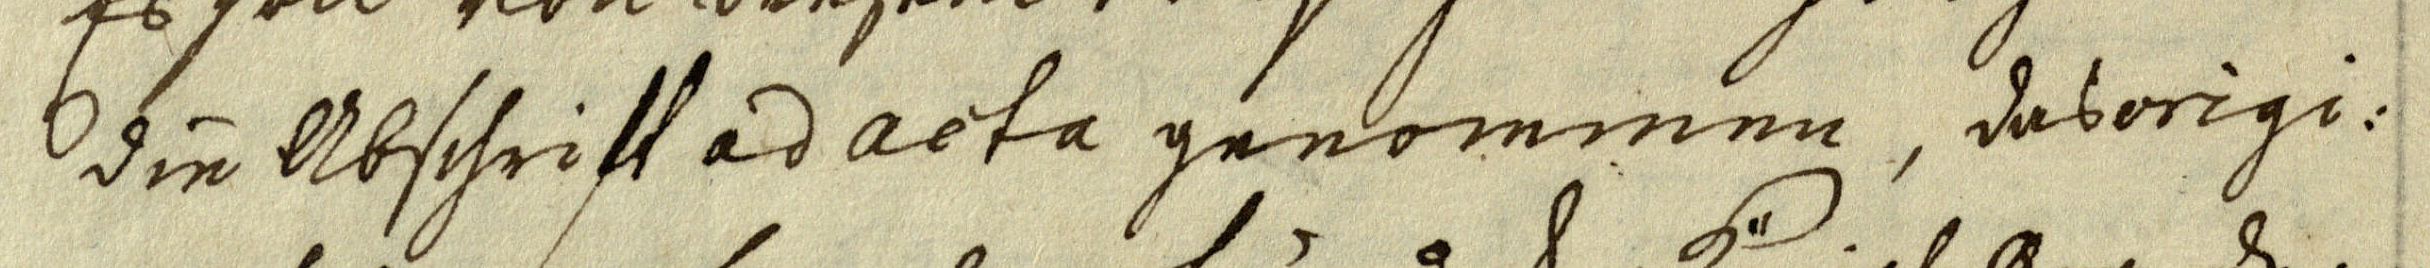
die Abschrift ad acta genommen, das origi¬
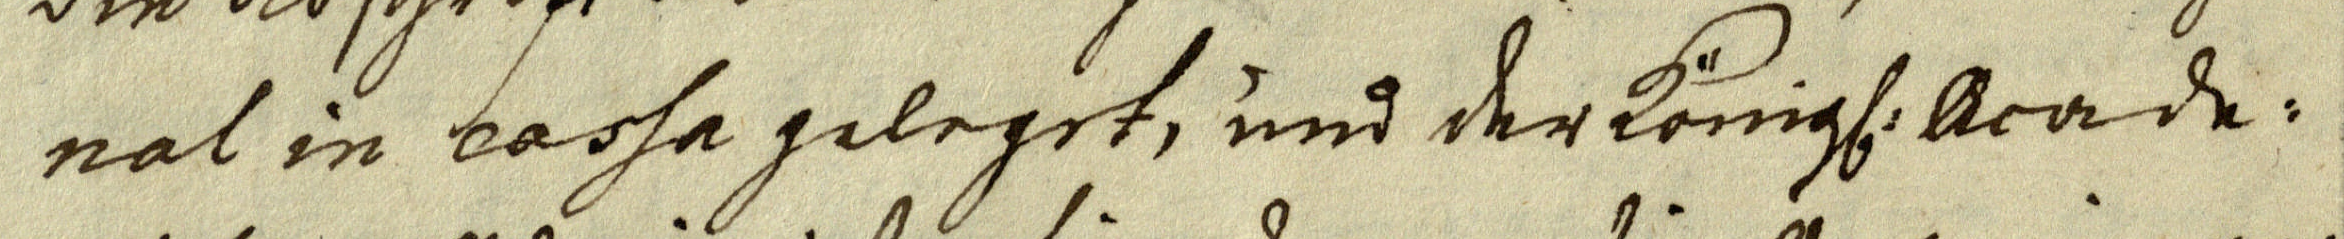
nal in cassa geleget, und der Königl: Acade¬
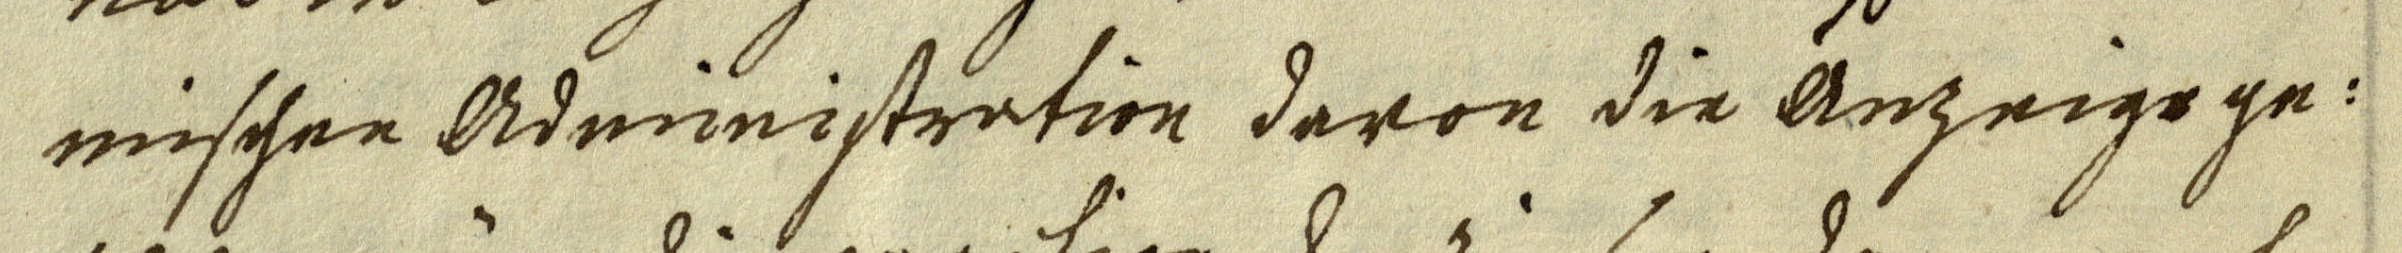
mischen Administration davon die Anzeige ge¬
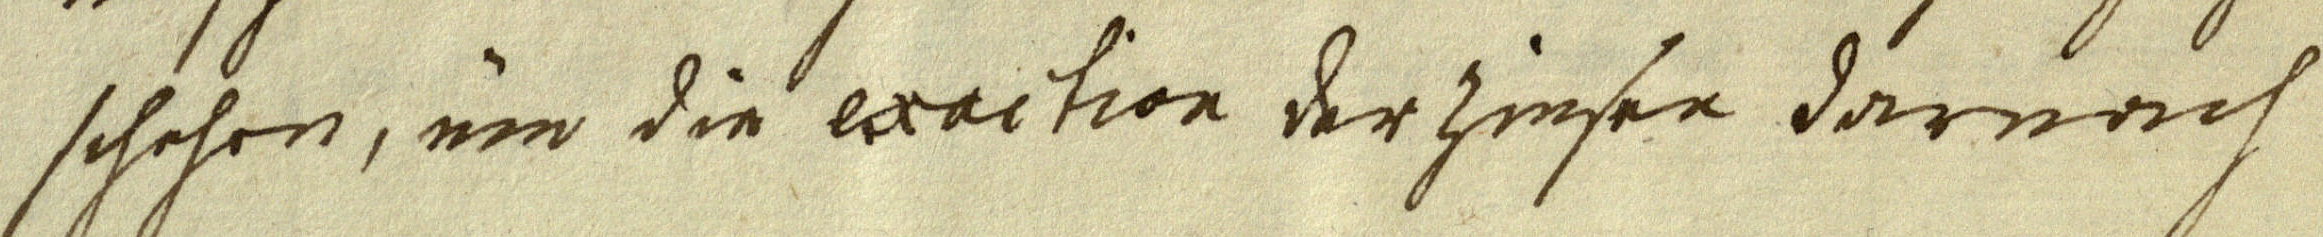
schehen, um die exaction der Zinsen darnach
